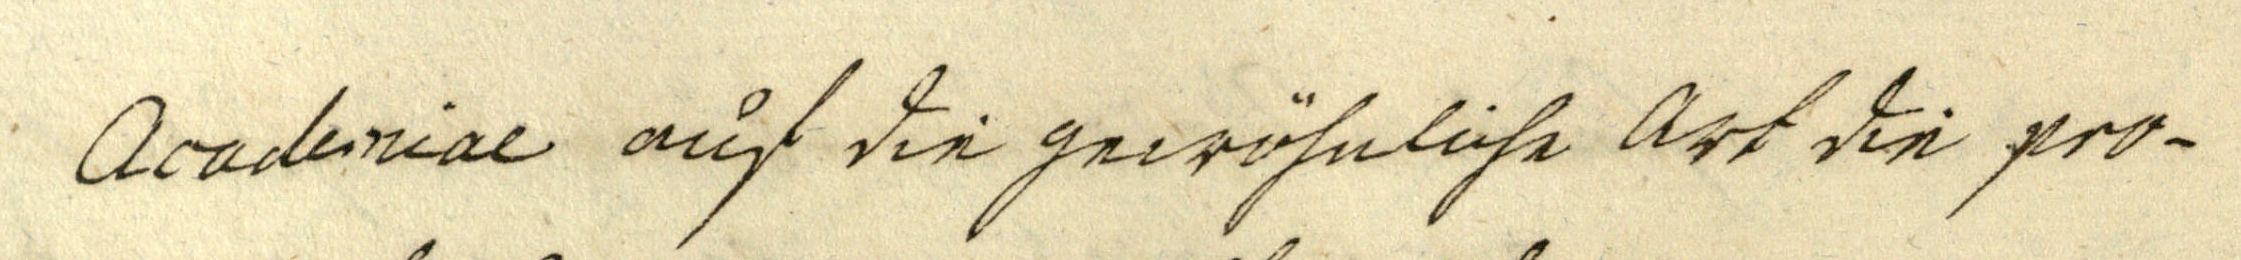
Academiae auf die gewöhnlichen Art die pro¬
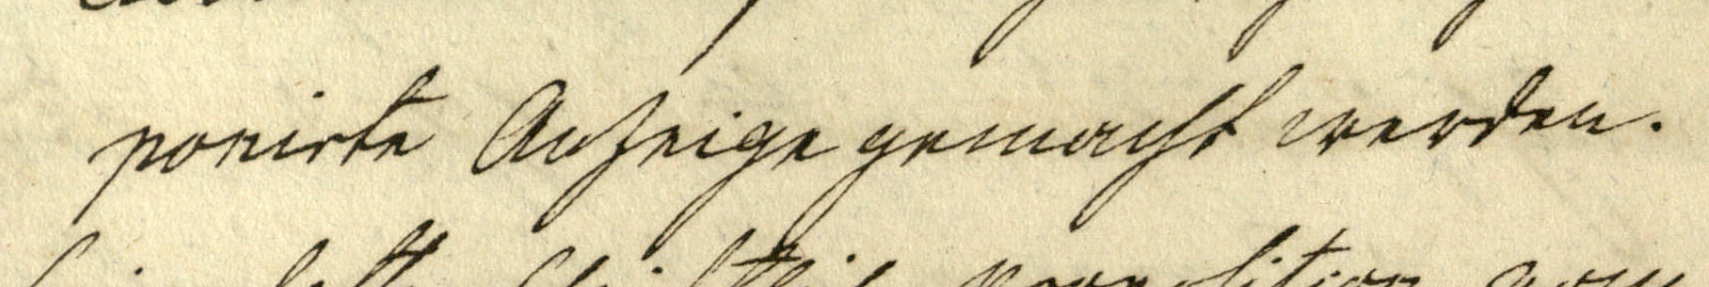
ponirte Anzeige gemacht werden.
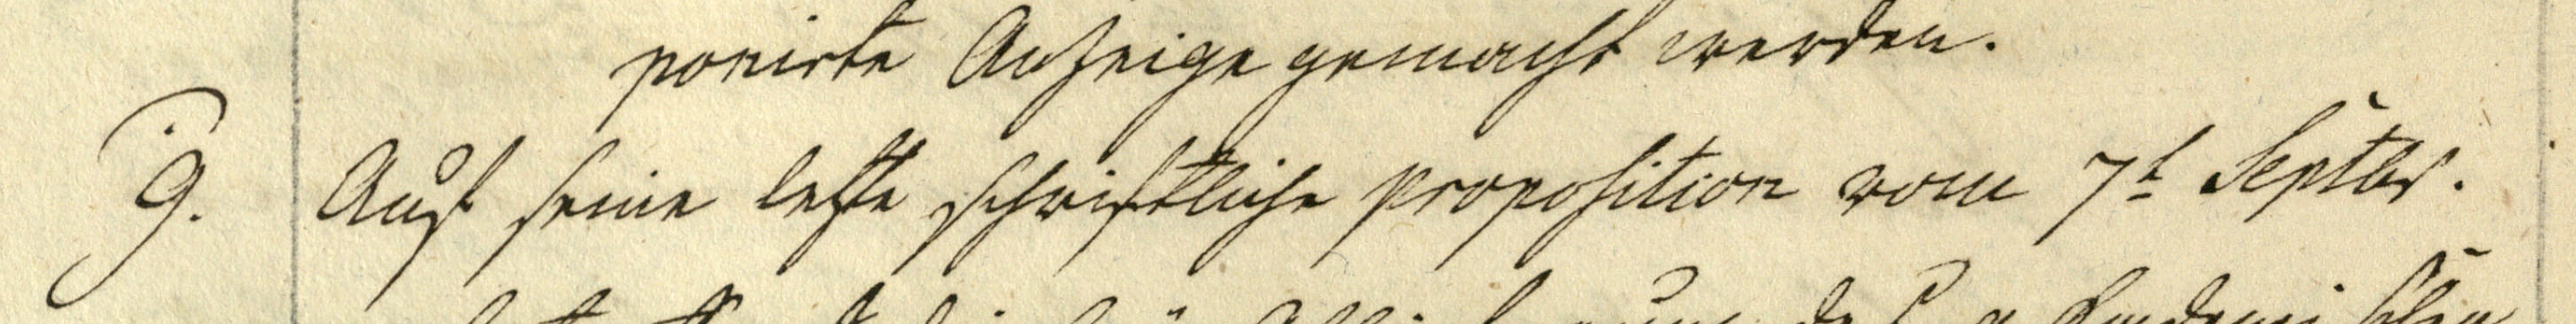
9. Auf seine letzte schriftliche proposition vom 7 t Septbr.
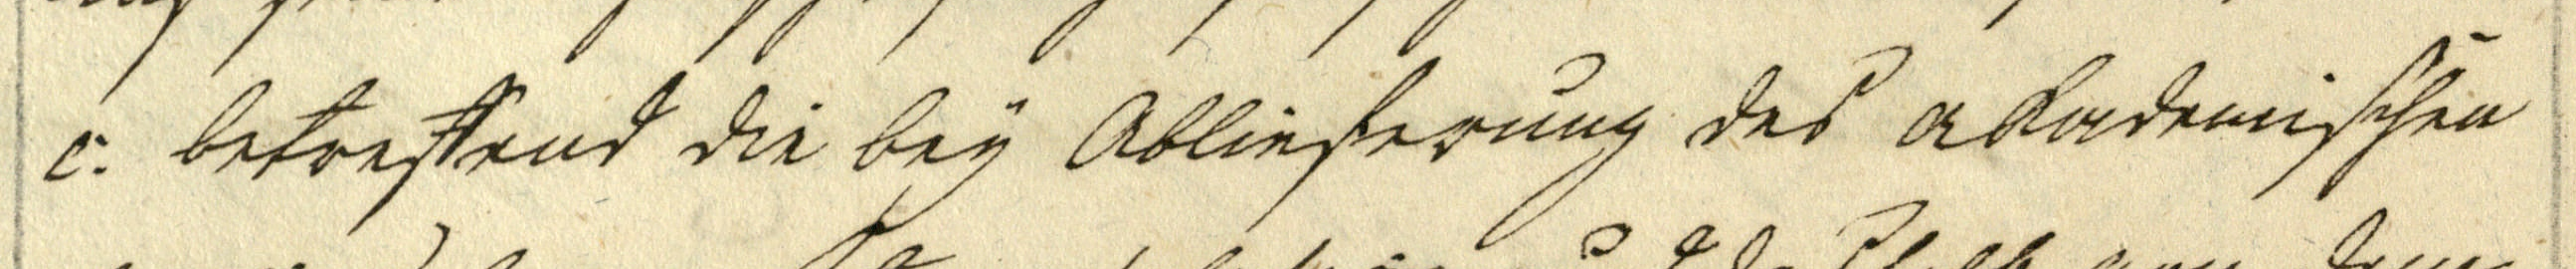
c. betreffend die beÿ Ablieferung des akademischen
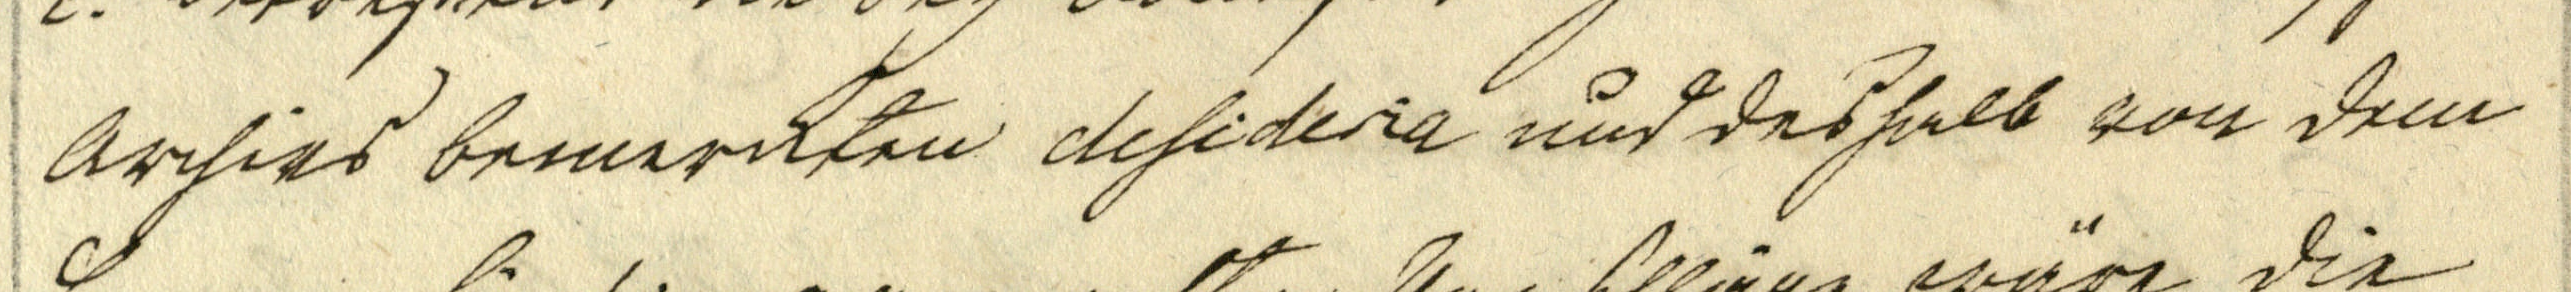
Archivs bemerckten desideria und deshalb von dem
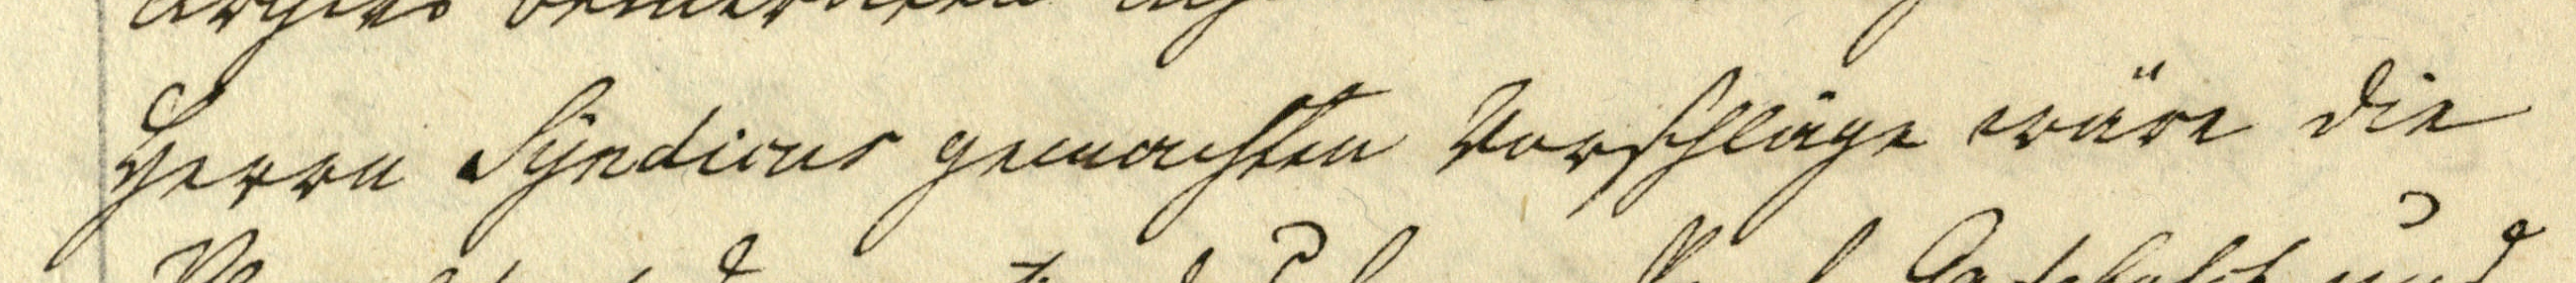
Herrn Sÿndicus gemachten Vorschläge wäre die
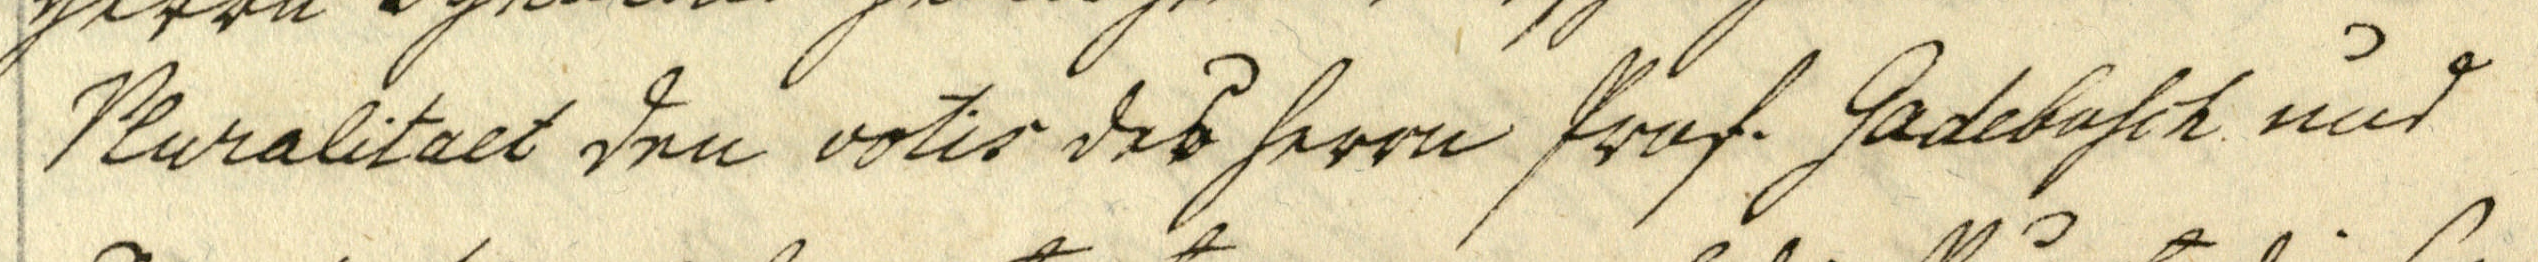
Pluralitaet den votis der Herrn Prof. Gadebusch und
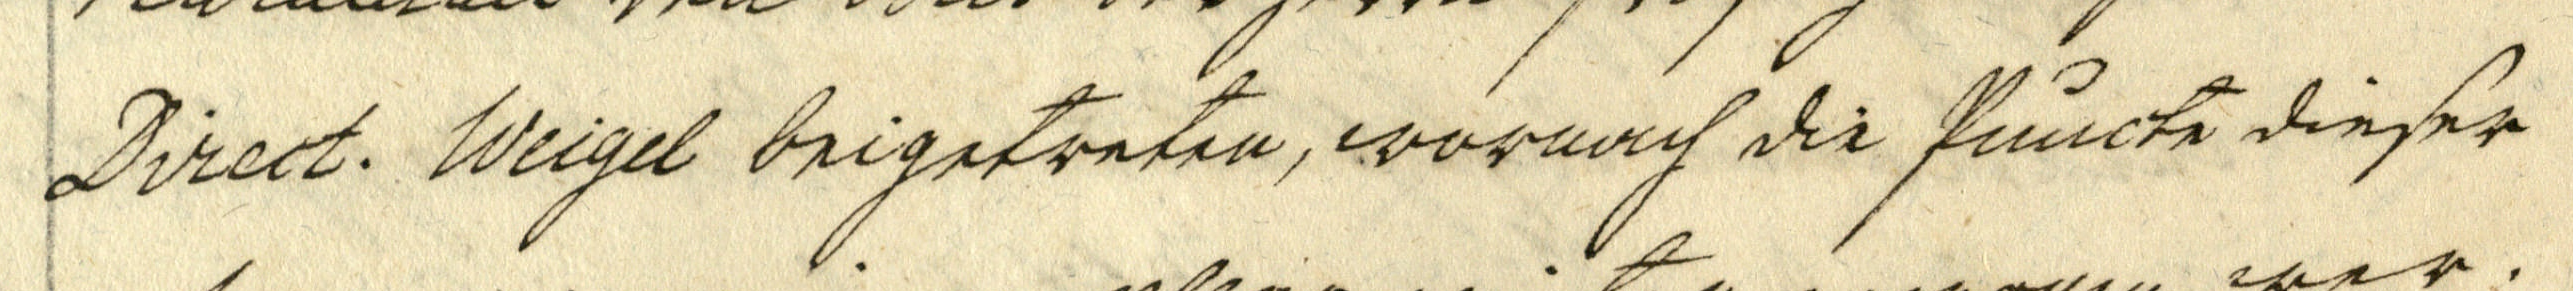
Direct. Weigel beigetreten, wornach die Puncte dieser
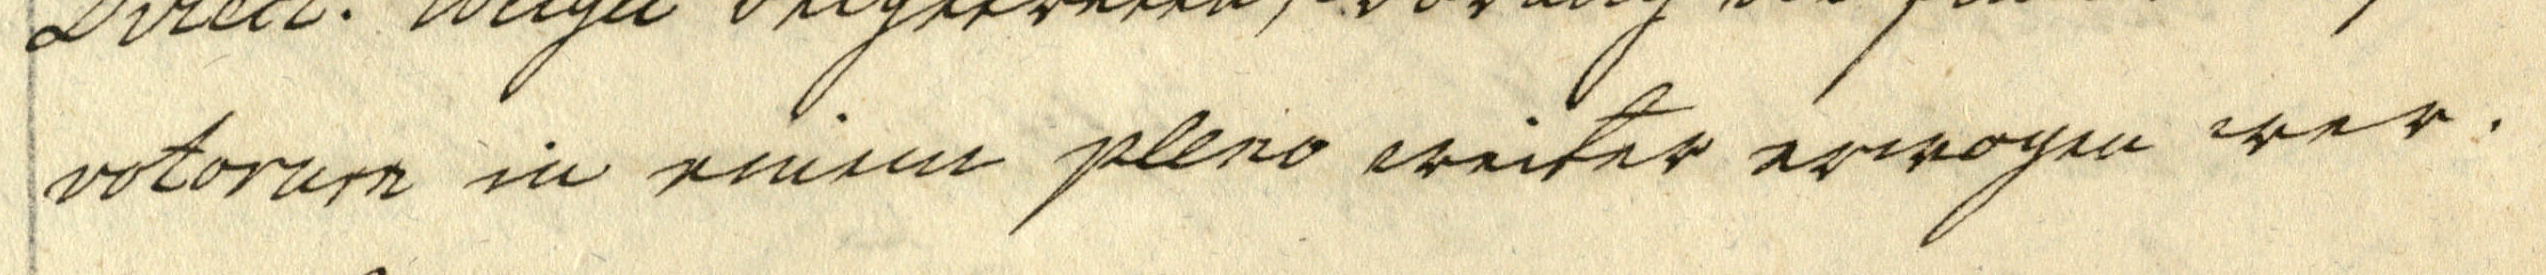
votorum in einem pleno weiter erwogen wer¬
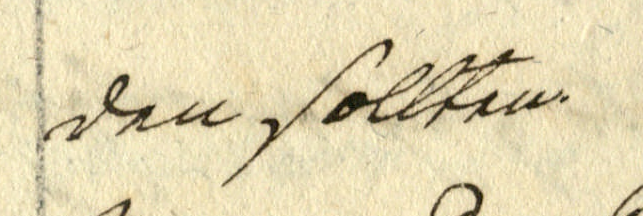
den sollten.
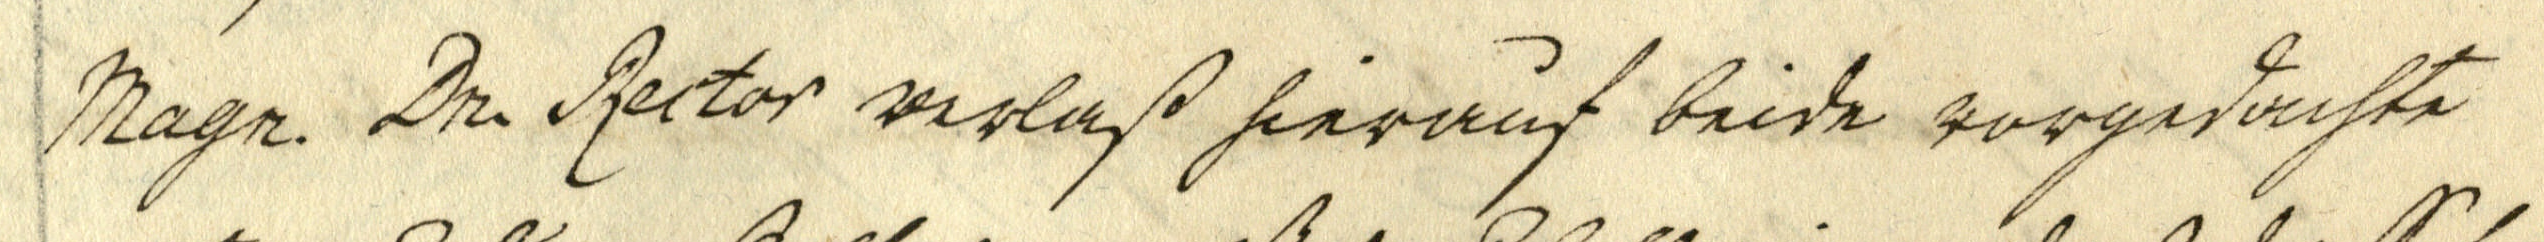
Magn. Dn. Rector verlaß hierauf beide vorgedachte
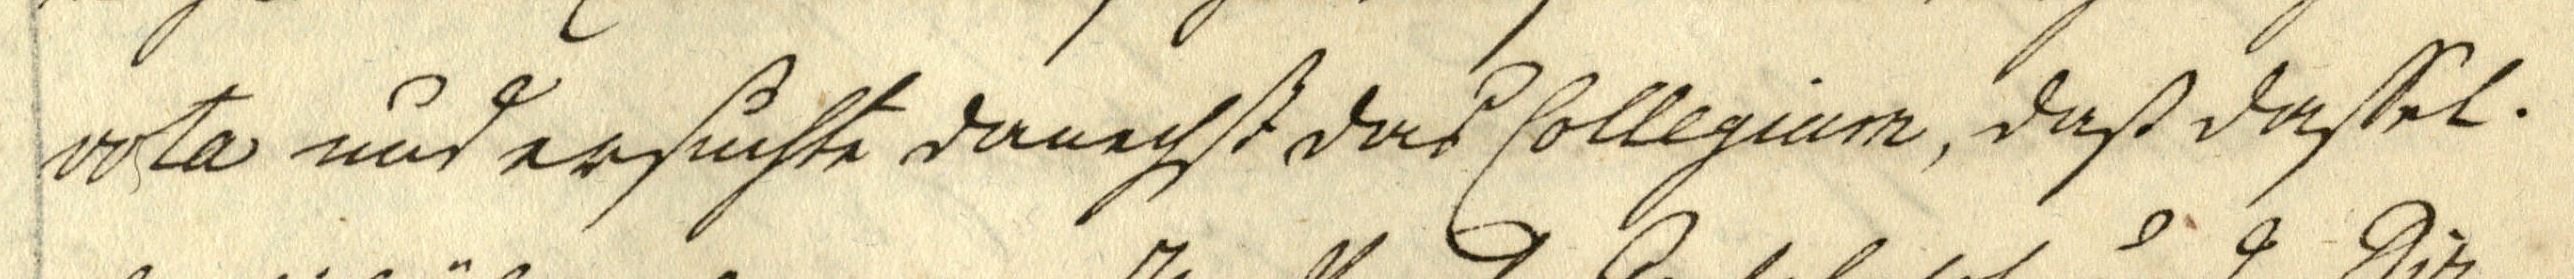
vota und ersuchte danechst das Collegium, daß dassel¬
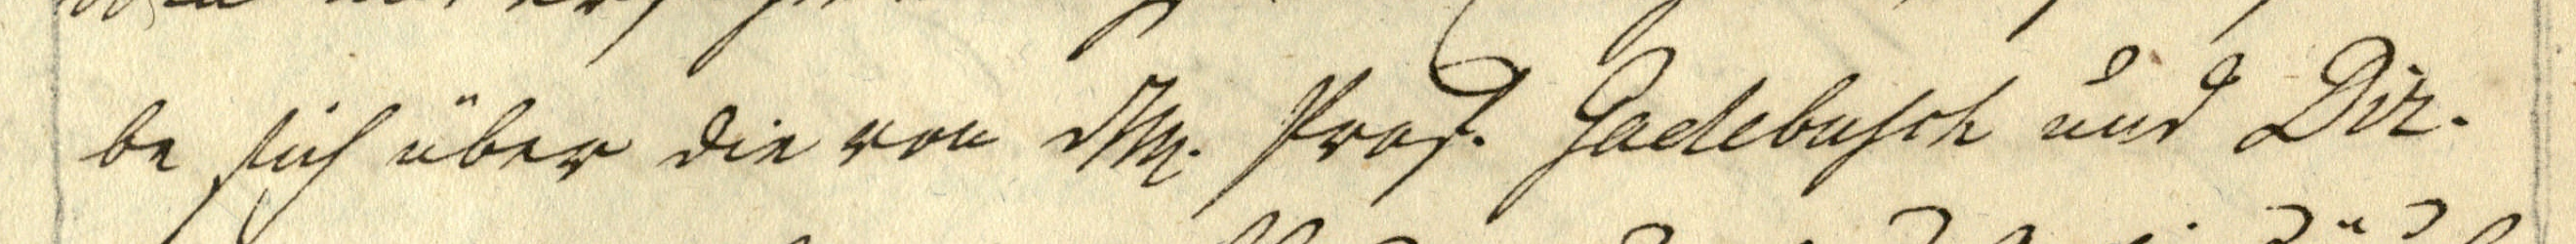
be sich über die von dh. Prof. Gadebusch und Dir.
